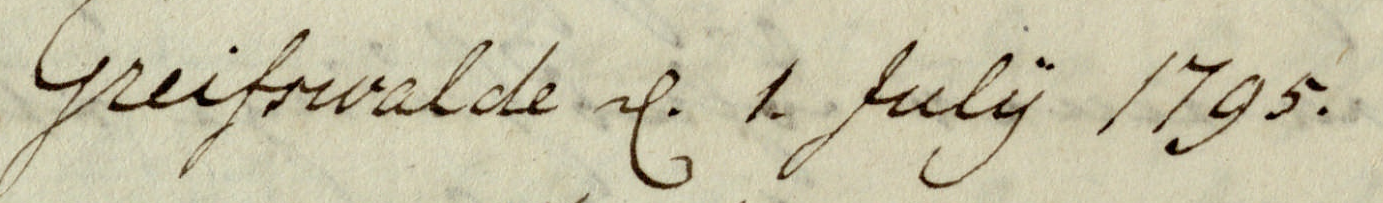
Greifswalde d. 1. Julÿ 1795.
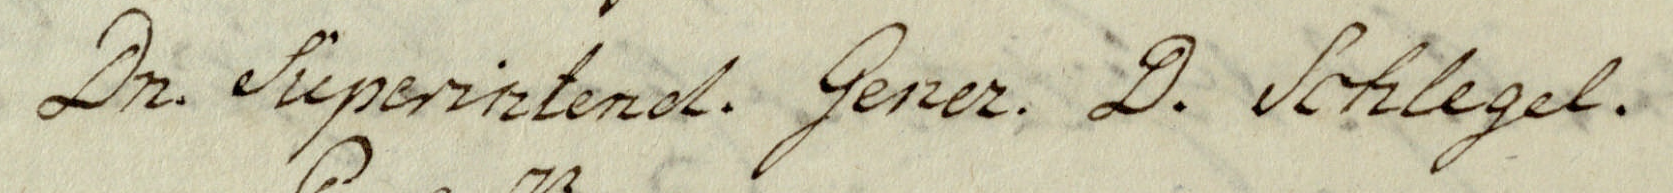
Dn. Superintend. Gener. D. Schlegel.
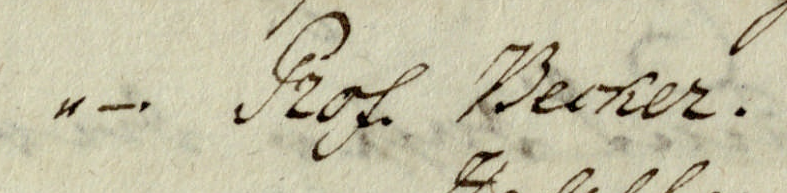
"—" Prof. Becker.
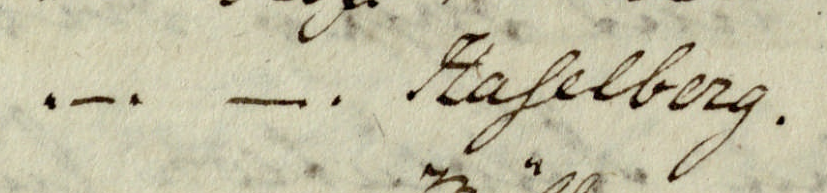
"—" — . Haselberg.
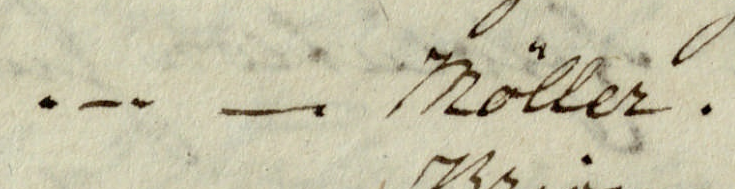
"—" — . Möller.
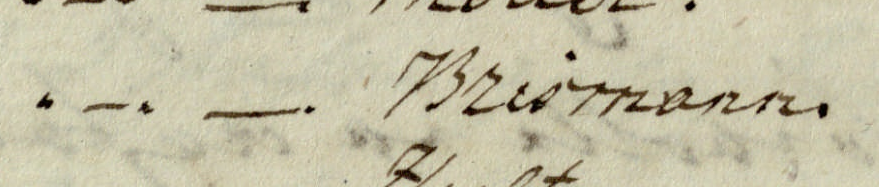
"—" — . Brismann.
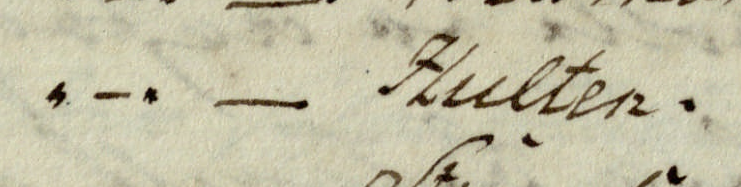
"—" — . Hulten.
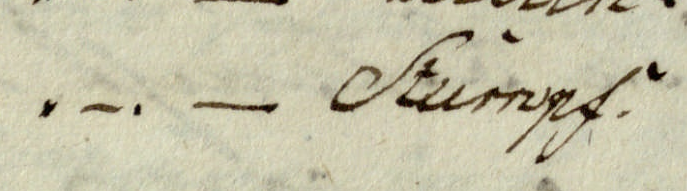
"—" — . Stumpf.
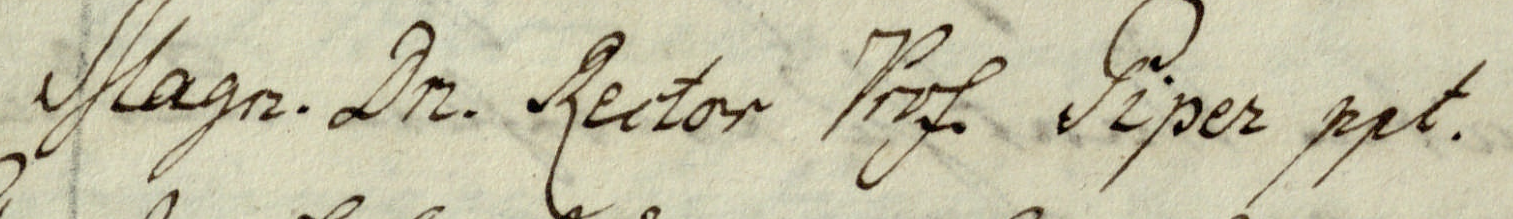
Magn. Dn. Rector Prof. Piper ppt.
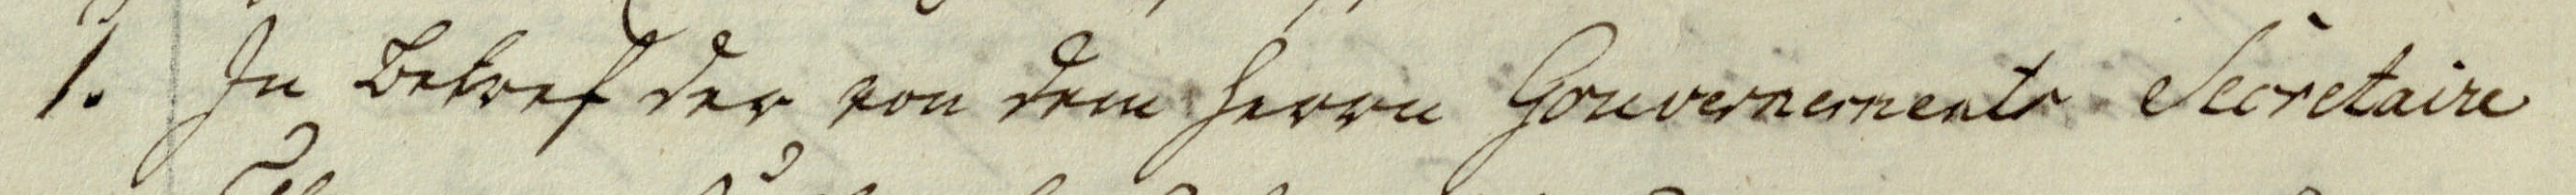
1. In Betref von dem Herrn Gouvernements Sécretaire
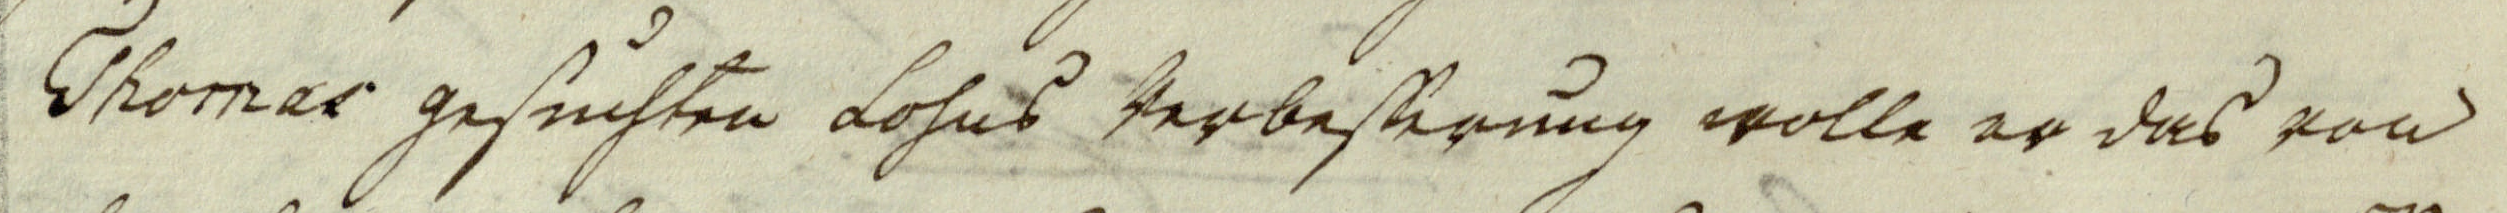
Thomas gesuchten Lohns Verbesserung wolle er das von
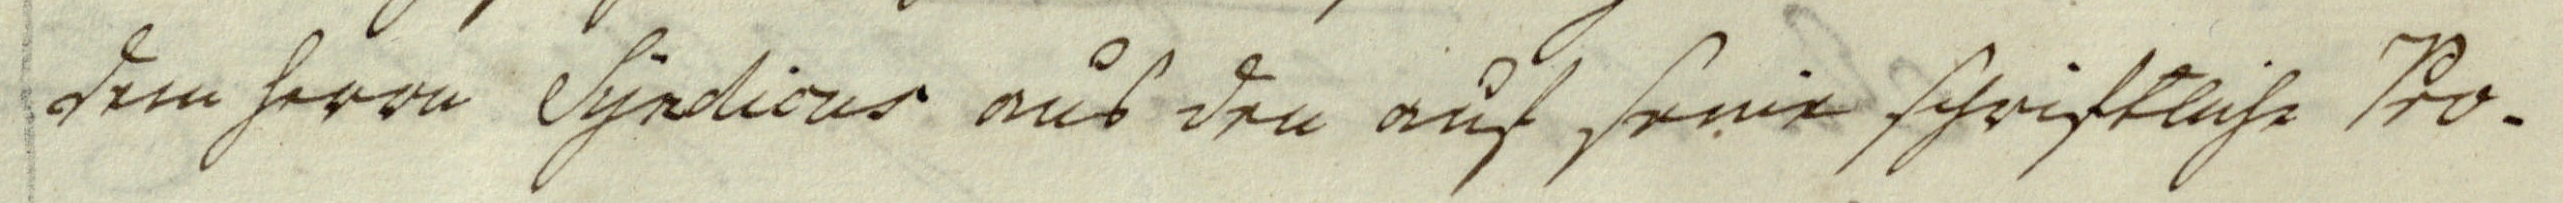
dem Herrn Sÿndicus aus den auf seine schriftliche Pro¬
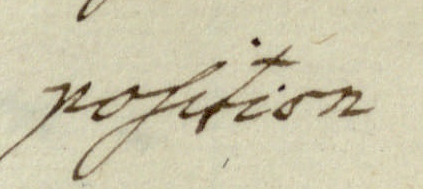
position
